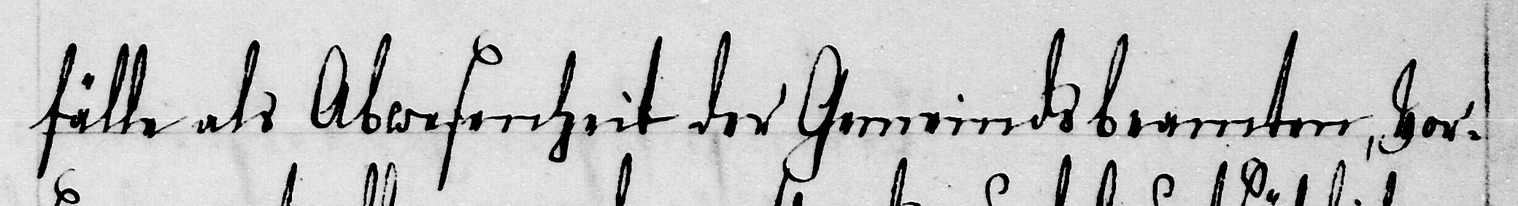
fälle als Abwesenheit der Gemeindsbeamten, Vor¬
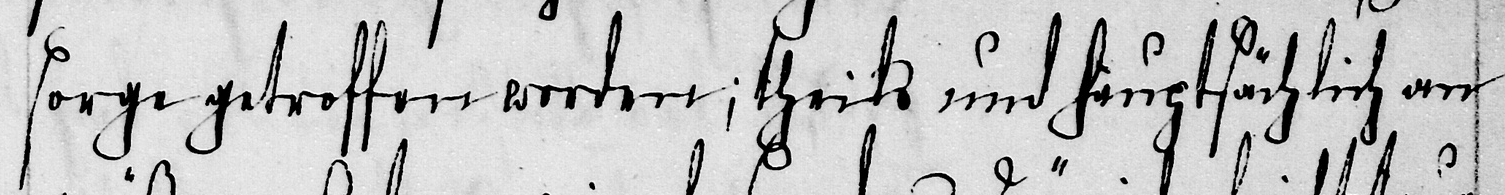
sorge getroffen worden; theils und hauptsächlich an
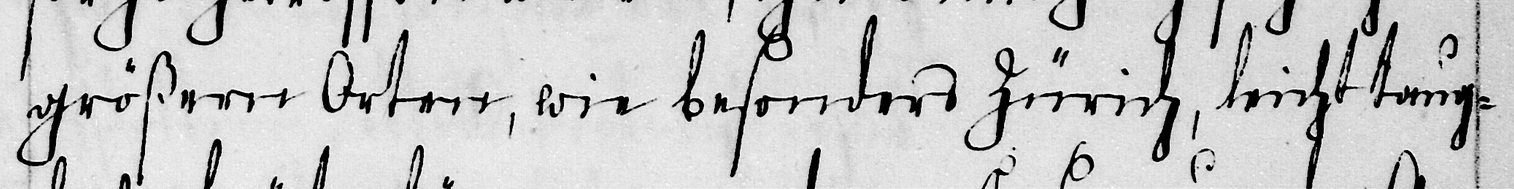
größern Orten, wie besonders Zürich, leicht taug¬
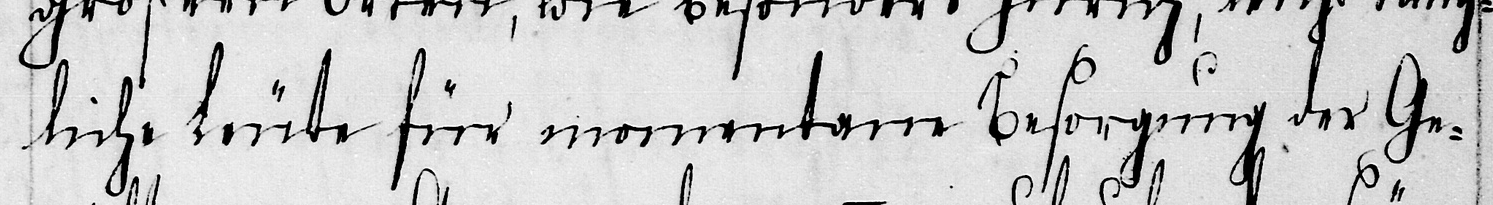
liche Leute für momentane Besorgung der Ge¬
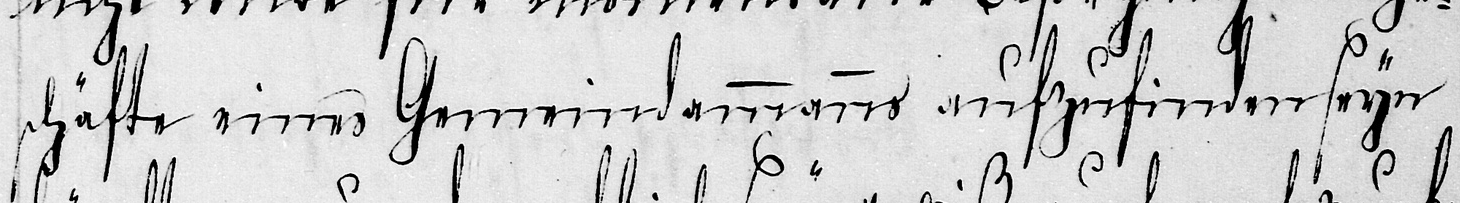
schäfte eines Gemeindammanns aufzufinden seyn
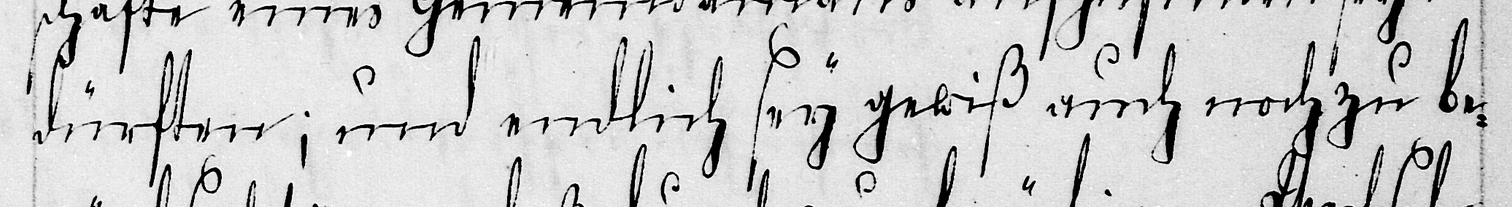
dürften; und endlich sey gewiß auch noch zu be¬
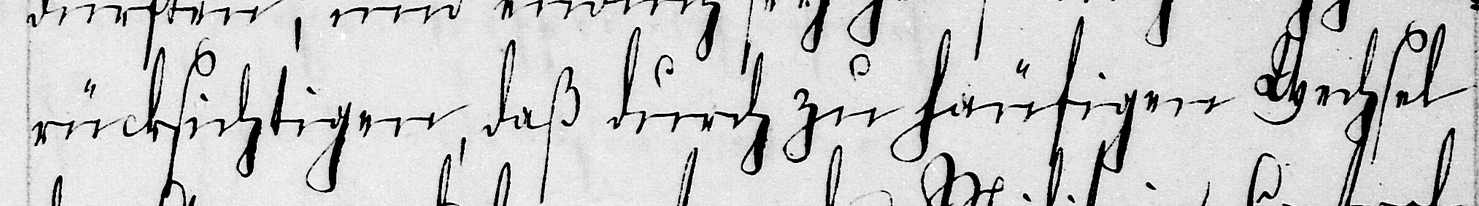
rücksichtigen, daß durch zu häufigen Wechsel
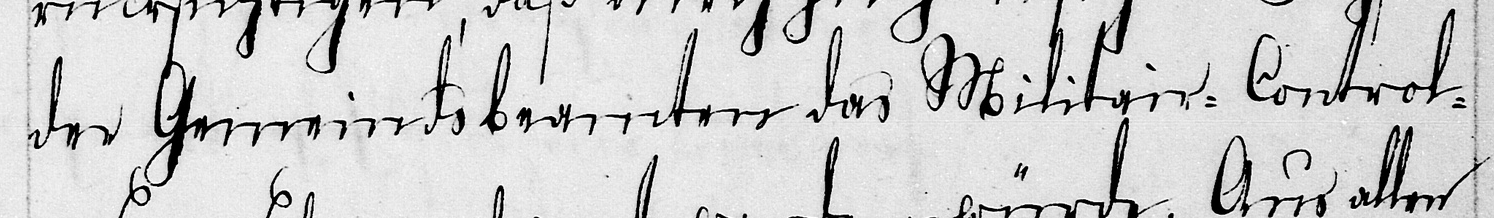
der Gemeindsbeamten das Militair-Control¬
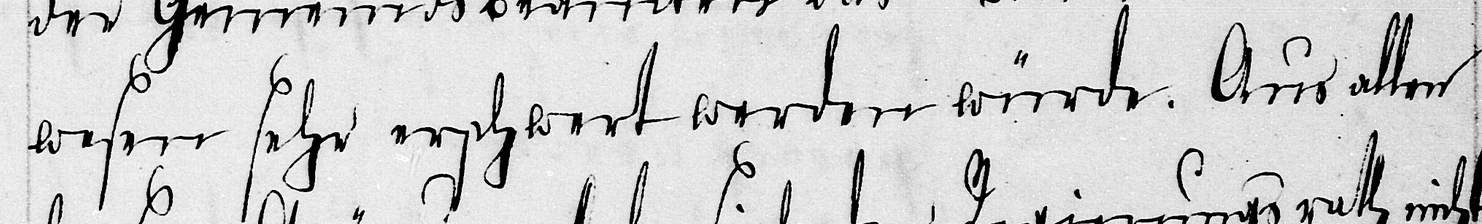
wesen sehr erschwert werden würde. Aus allen
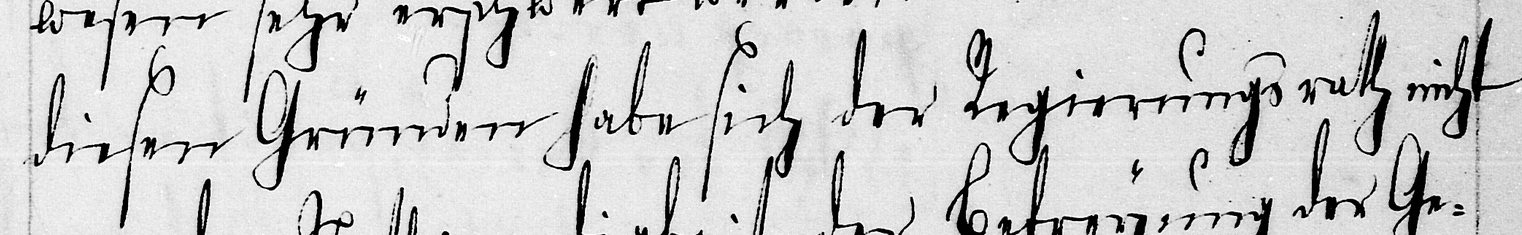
diesen Gründen habe sich der Regierungsrath nicht
